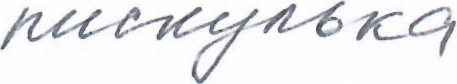пискулька
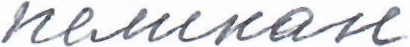пеликан
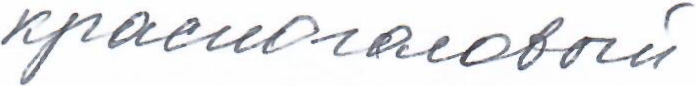красноголовый
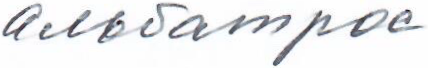альбатрос
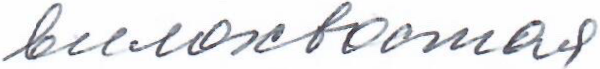вилохвостая
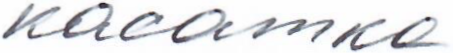касатка
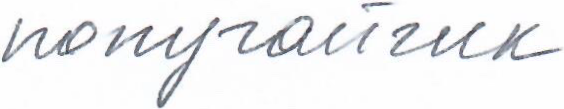попугайчик
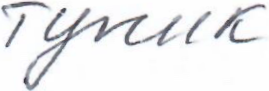тупик
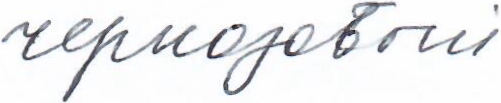чернозобый
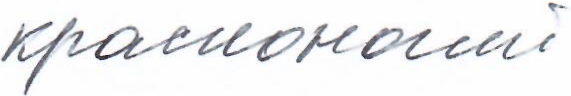красноногий
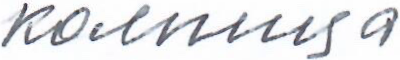колпица
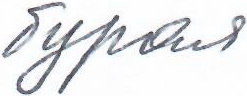бурая
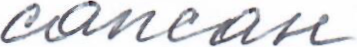сапсан
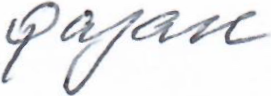фазан
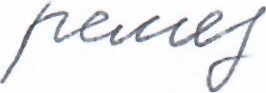ремез
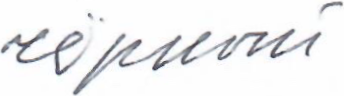чёрный
